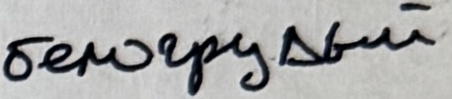белогрудый
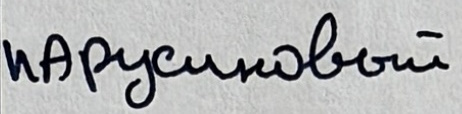парусиновый
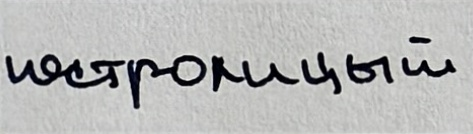постролицый
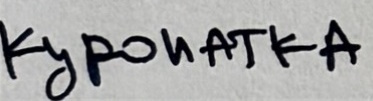куропатка
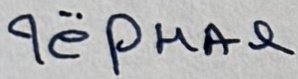чёрная
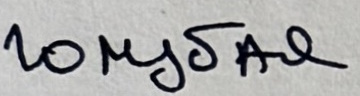голубая
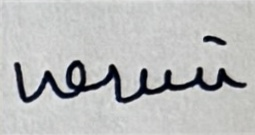пегий
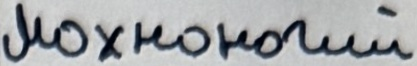мохноногий
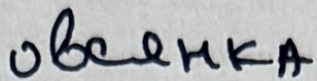овсянка
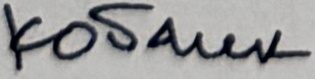кобчик
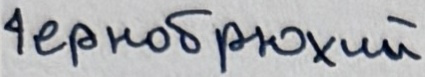чернобрюхий
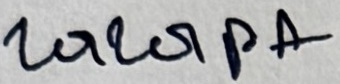гагара
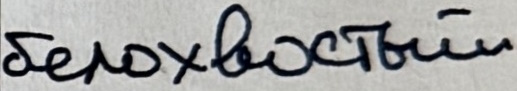белохвостый
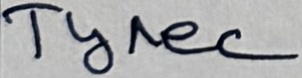тулес
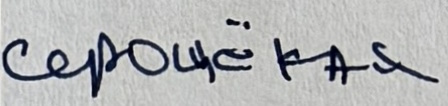серощёкая
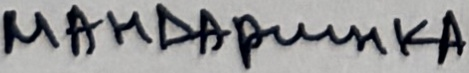мандаринка
